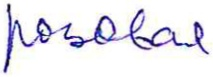розовая
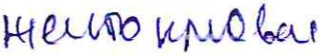желто клювая
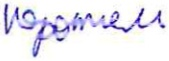коростель
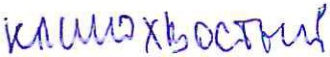клинохвостый
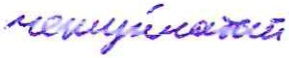чешуйчатый
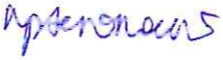крхполосый
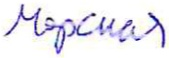морская
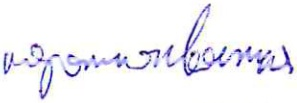кяроткохвостая
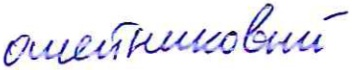ошейниковый
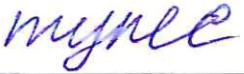тулес
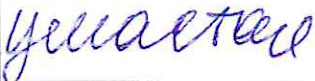ушастая
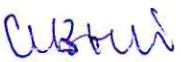сизый
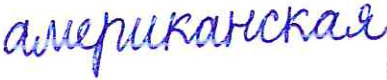американская
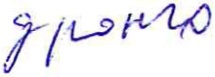дронго
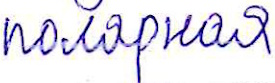полярная
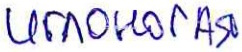иглоногая
